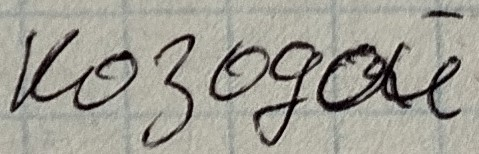козодой
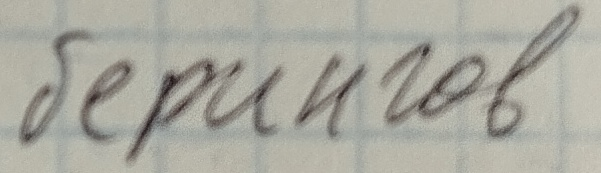берингов
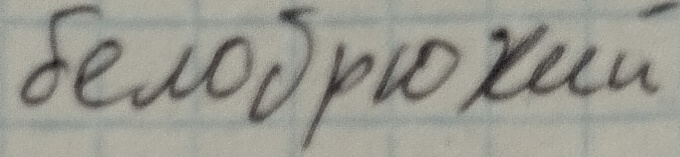белобрюхий
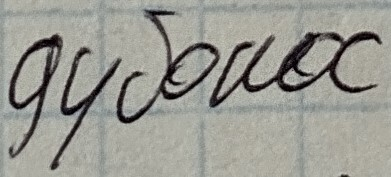дубонос
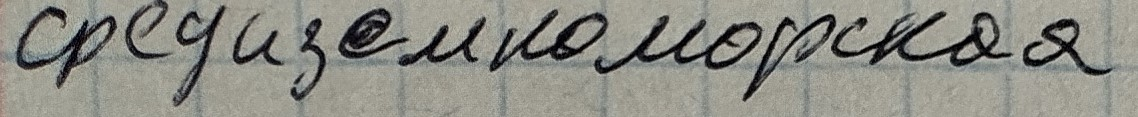средиземноморская
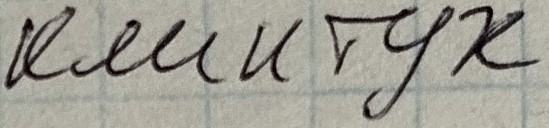клинтух
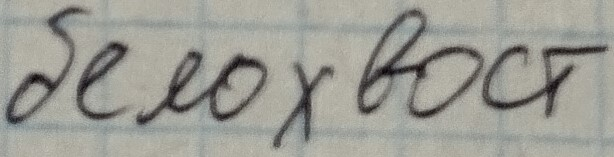белохвост
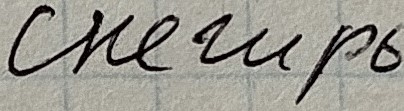снегирь
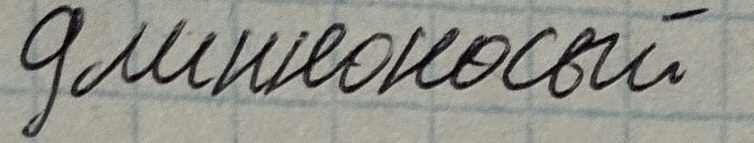длинноносый
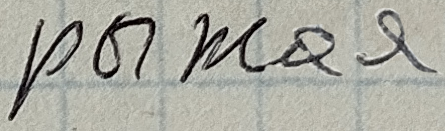рыжая
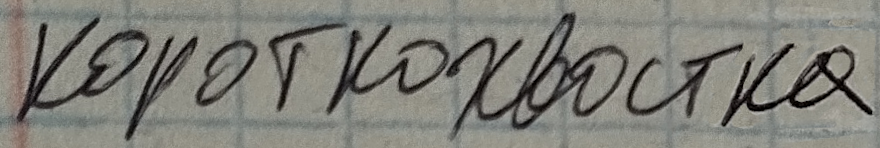короткохвостка
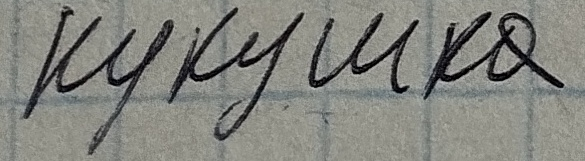кукушка
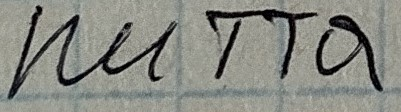питта
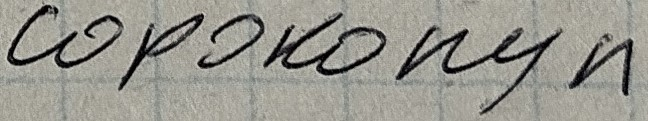сорокопуп
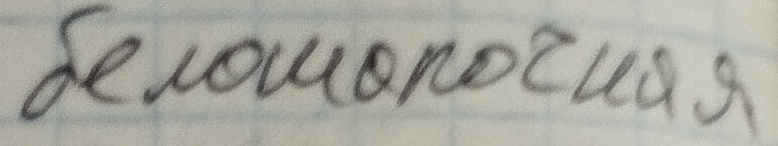белошапочная
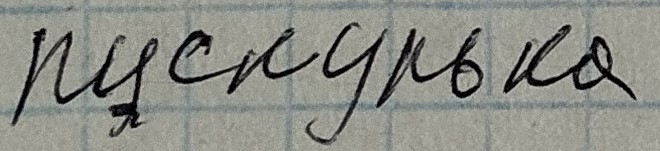пискулька
